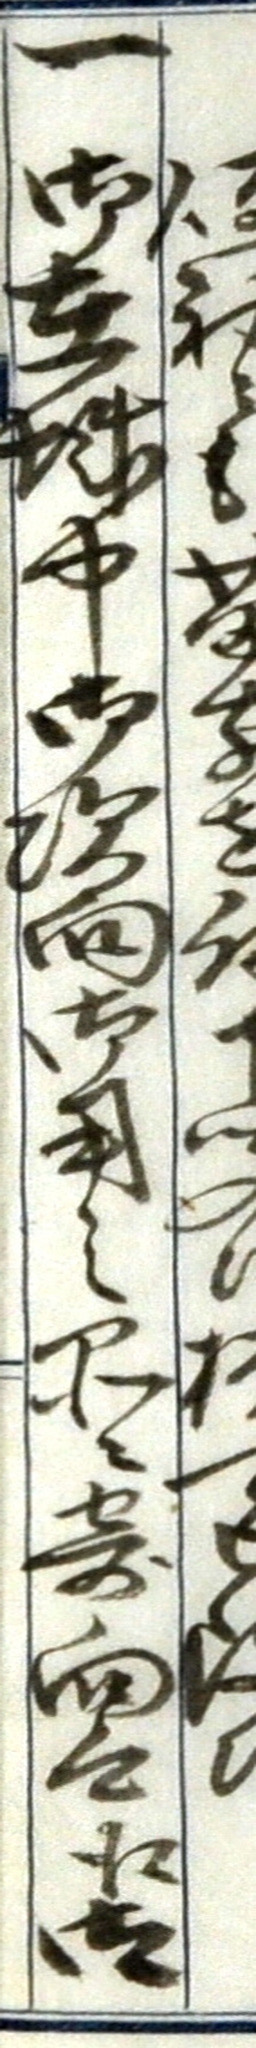一御在城中御次向御用之品ニ寄向ひ江御

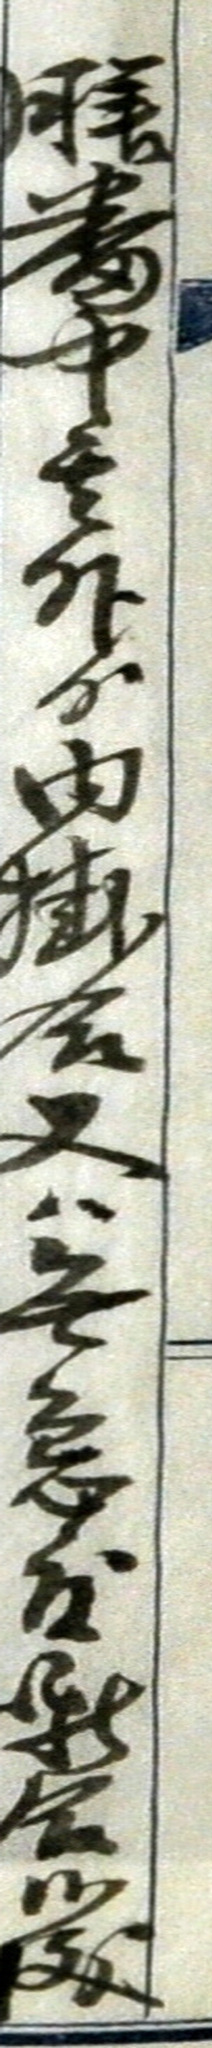膳番中其外ゟ由掛合又ハ無急度噺合候儀
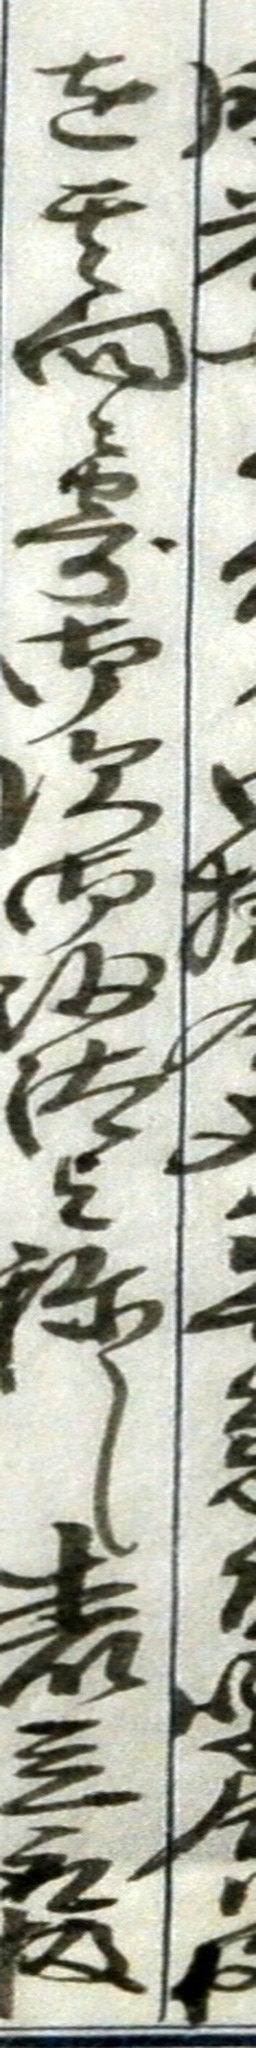を其向ニ寄御次御沙汰と称し表立取扱
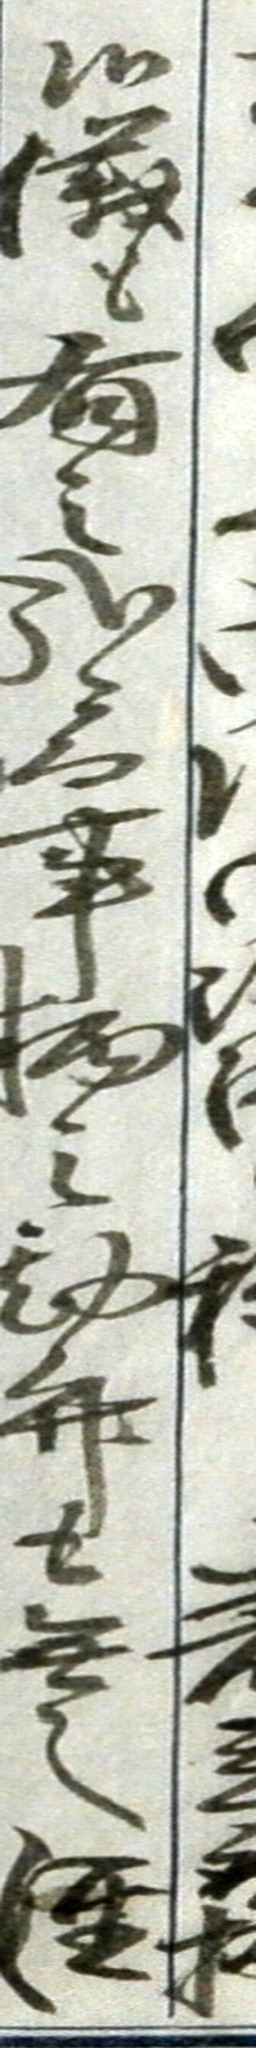候儀も有之哉ニ而事柄之勘弁も無之軽
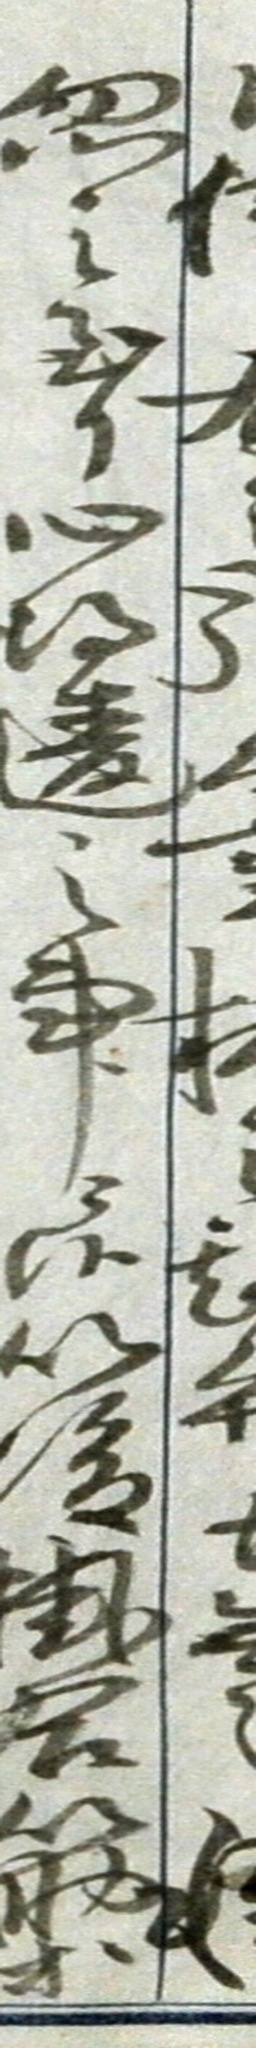忽之至り心得違之事ニ候以後掛合筋等
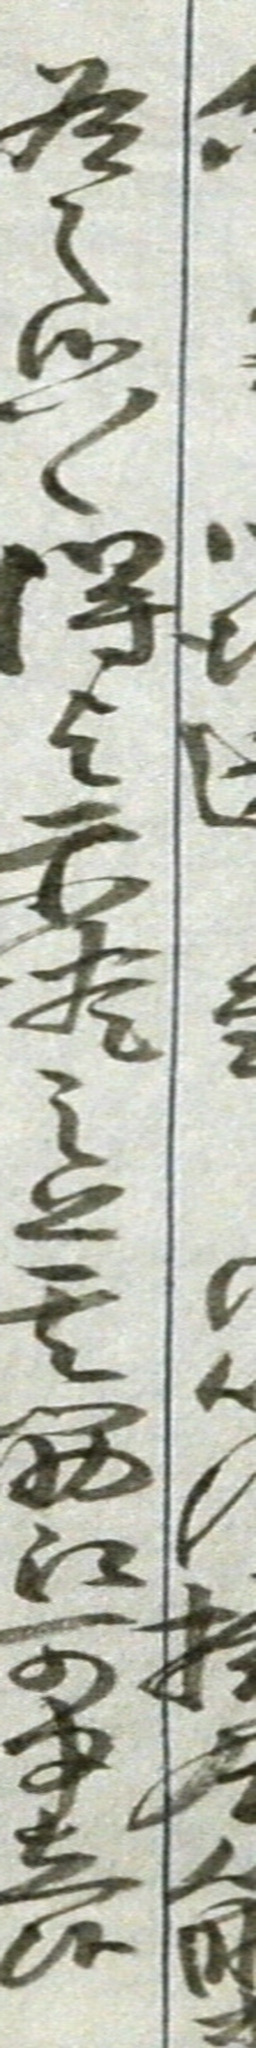有之候ハヽ得与示談之上其筋江可申立候
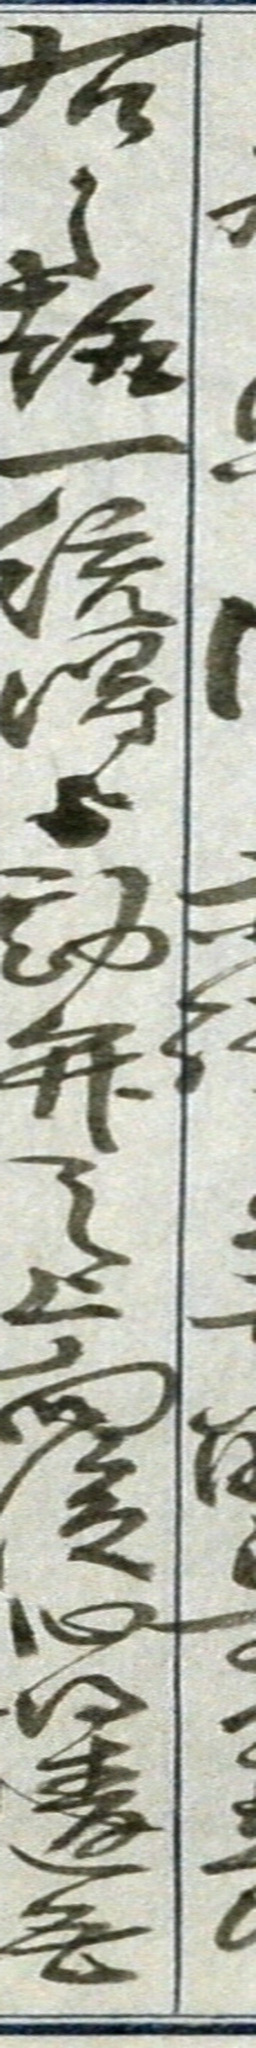右之趣一統得与勘弁之上向後心得違無
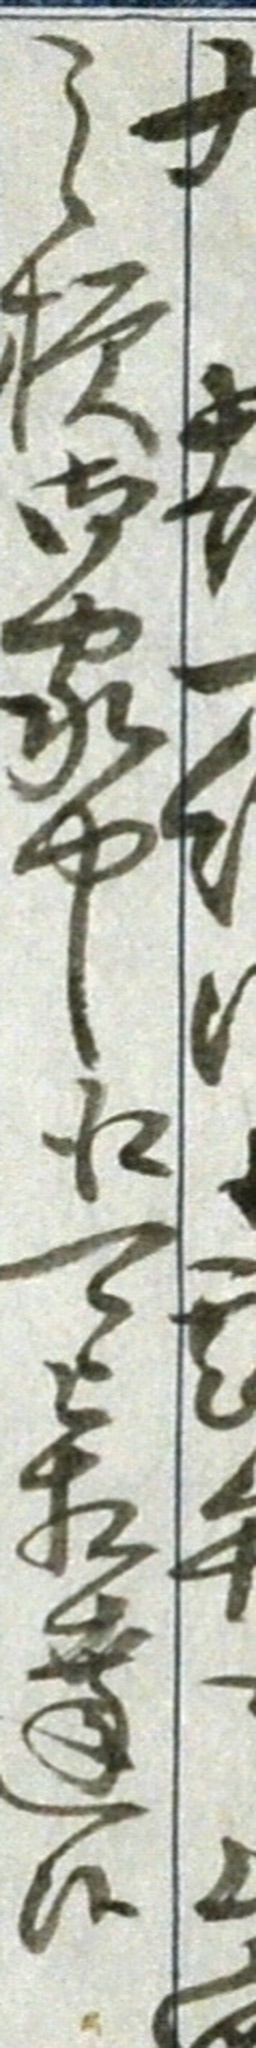之様御家中江可被相達候
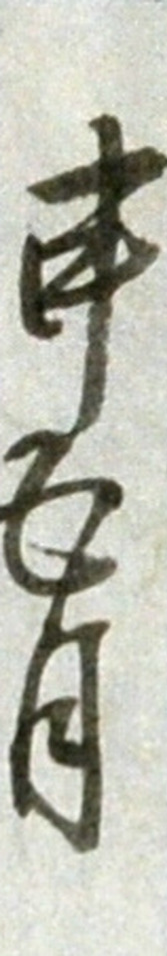申五月
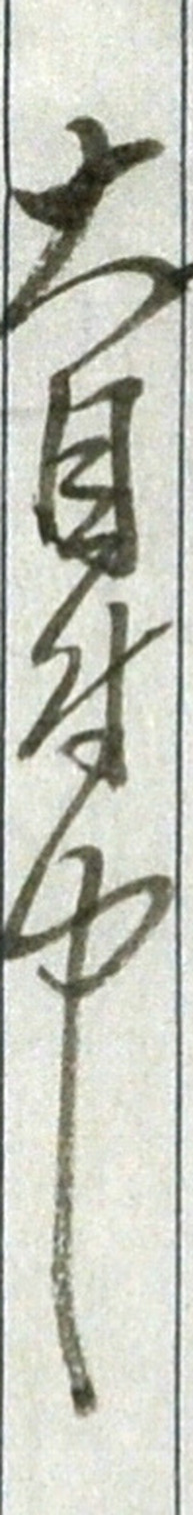大目付中
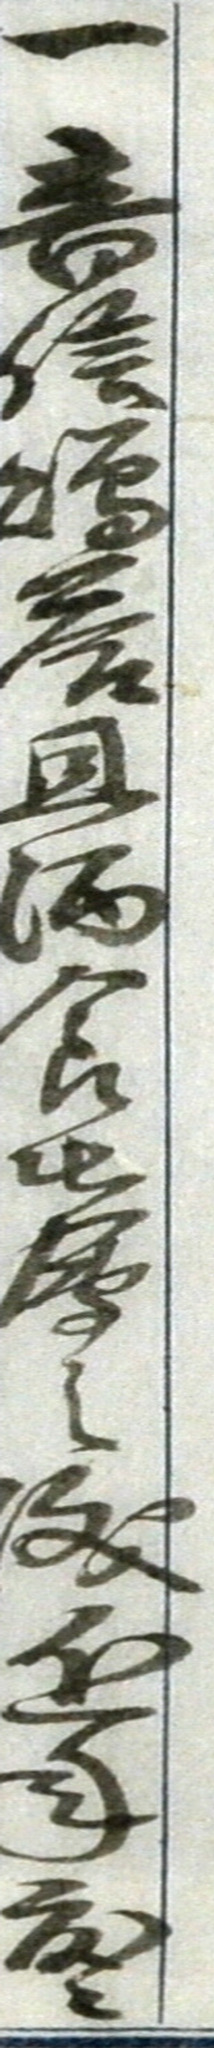一音信贈答且酒食出会之儀近年度々
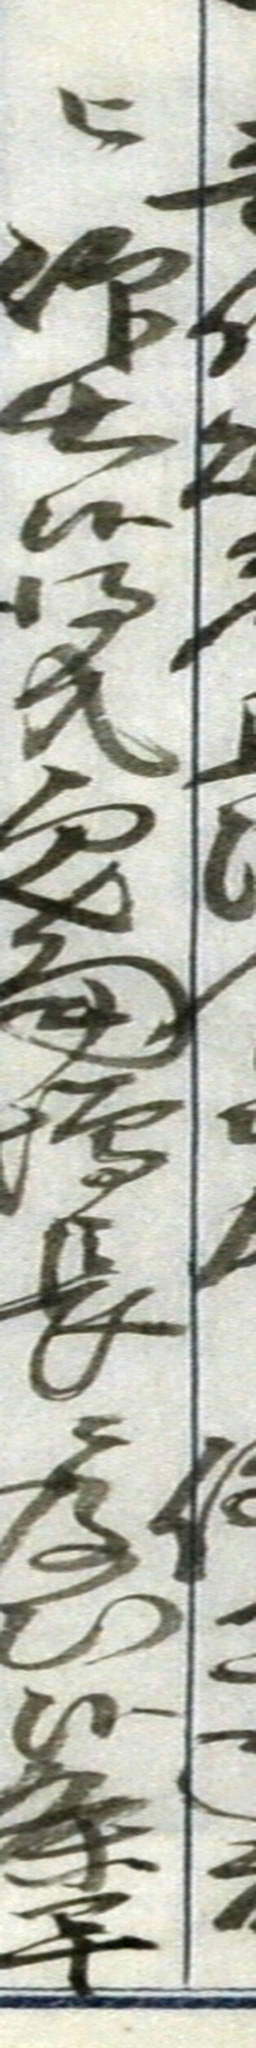被仰出候得共兎角増長ニ及ひ候条畢
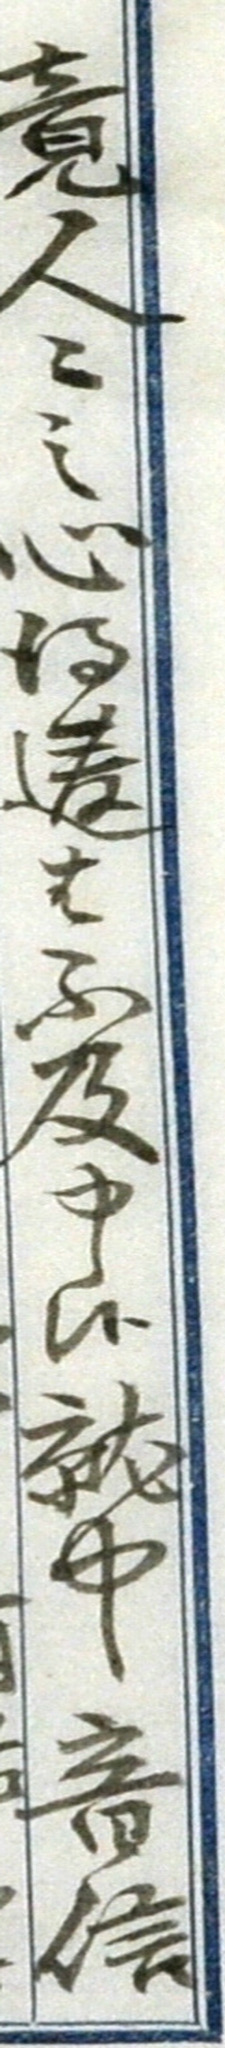竟人々之心得違は不及申候就中音信
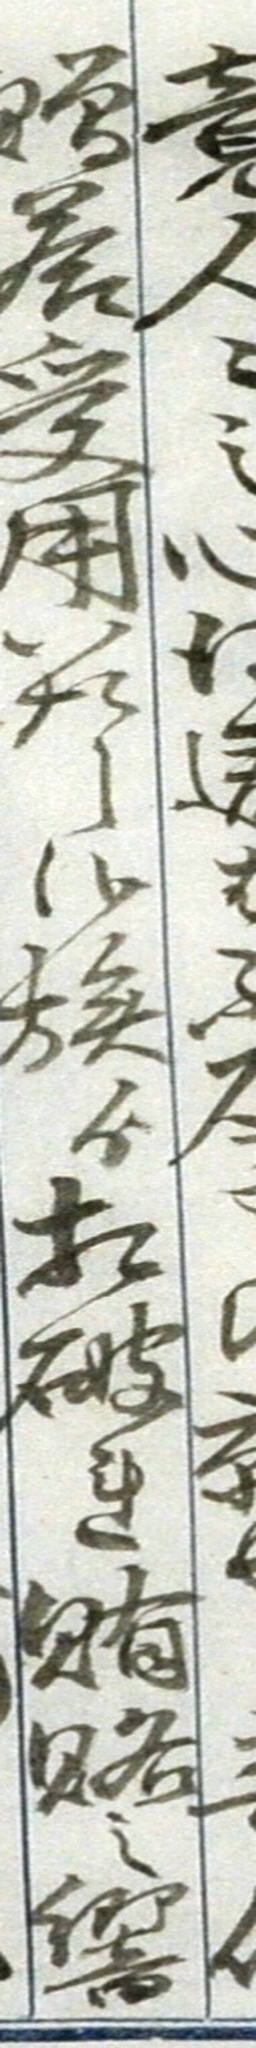贈答受用いたし候族ゟ相破れ賄賂之響
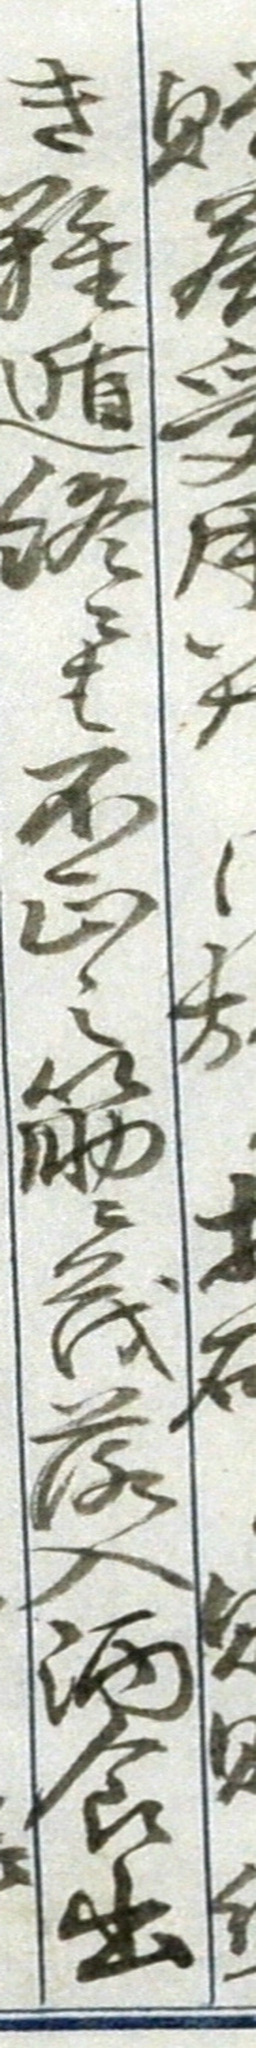き難遁終ニは不正之筋ニも落入酒食出
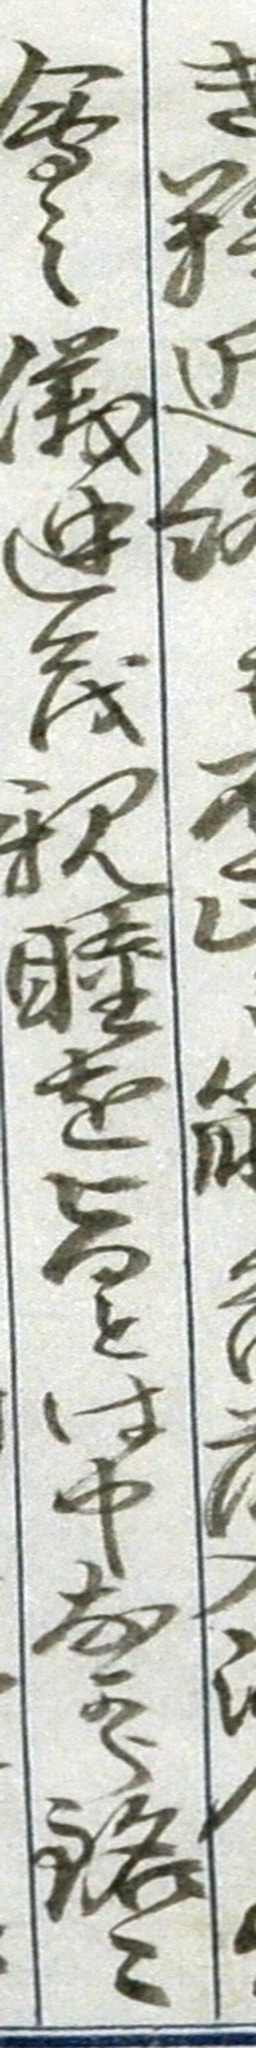会之儀迚も親睦を旨とは申なから銘々
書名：御倹約被仰出書
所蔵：伊那市立高遠町図書館・合同会社AMANE
